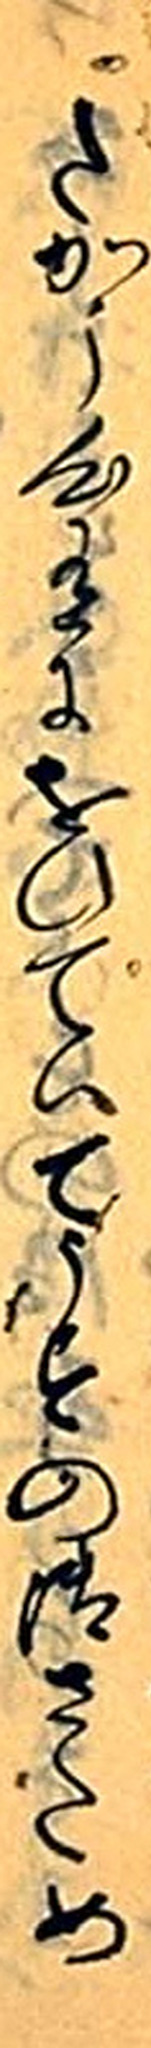たかう心有にをひてはてうすの御さため
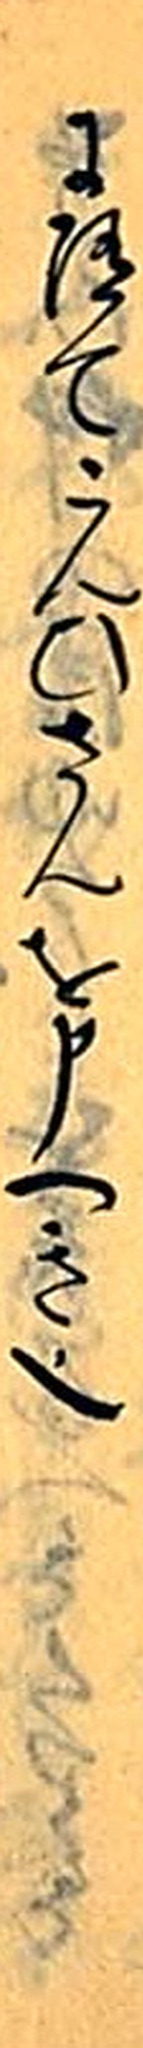に随てこんひさんを申へき也
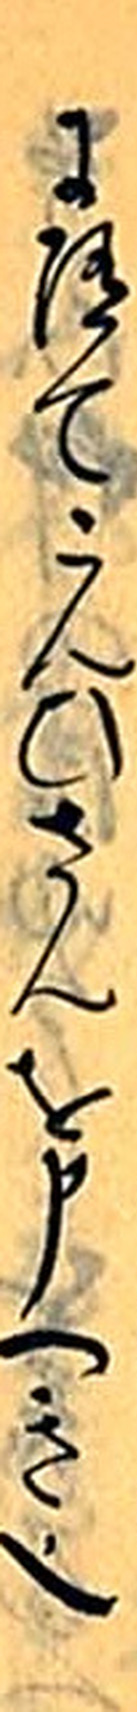に随てこんひさんを申へき也
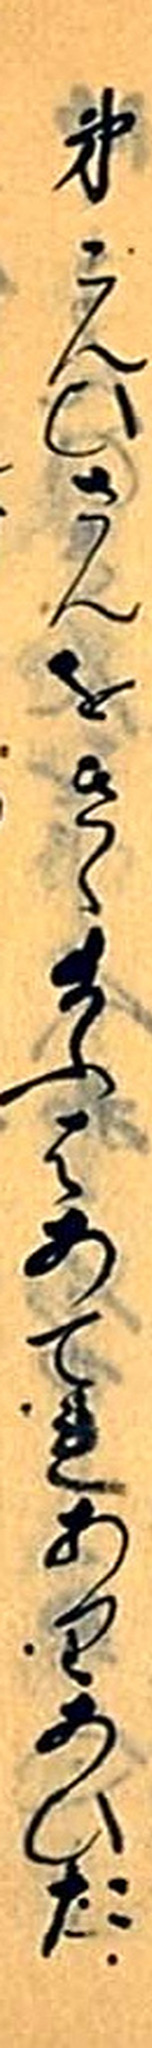弟こんひさんをきゝ給ふはあてれありあひた
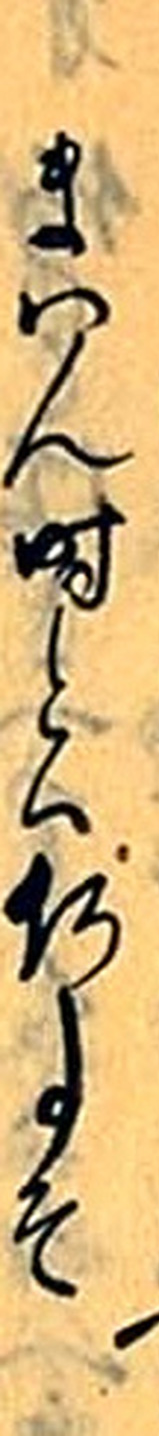まはん時とは何事そ
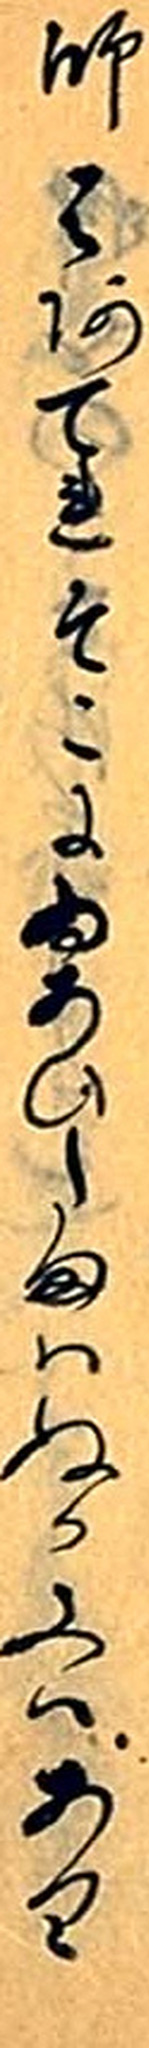師はあてれそこにゐあひたまはぬか又はあり
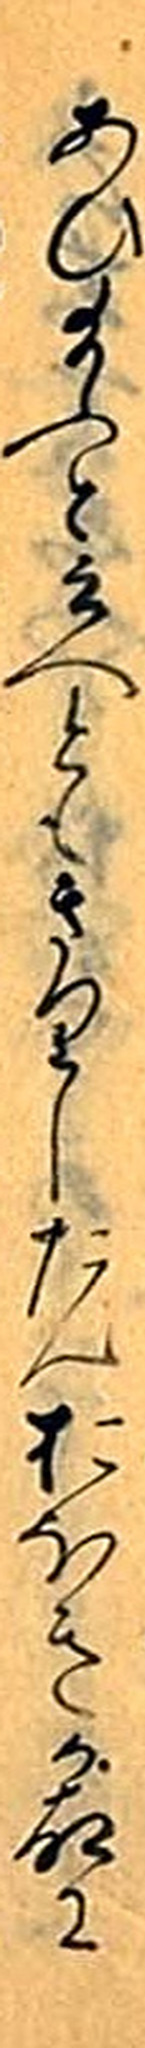あひ給ふと云へともきりしたんおほきか故に
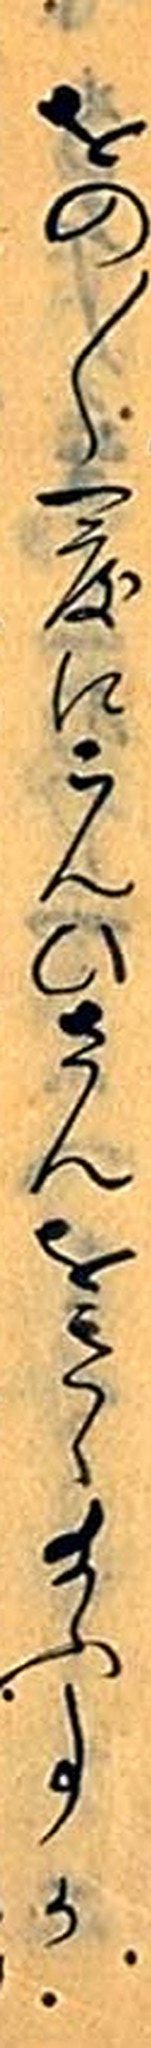をの〳〵一度にこんひさんをきゝ給ふ事か
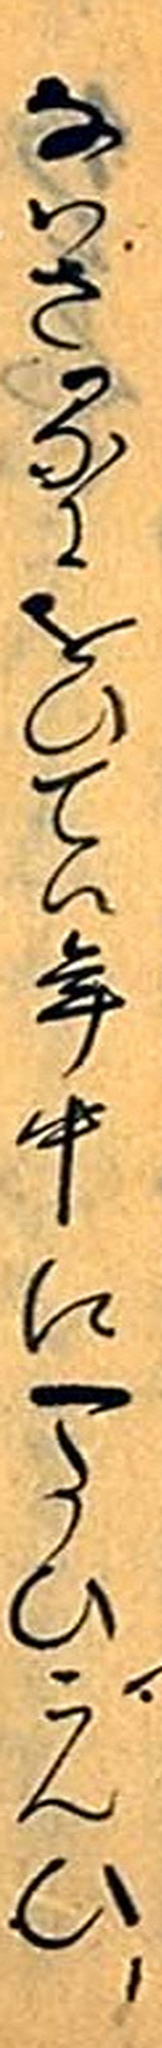なはさるにをひては年中に一たひこんひ
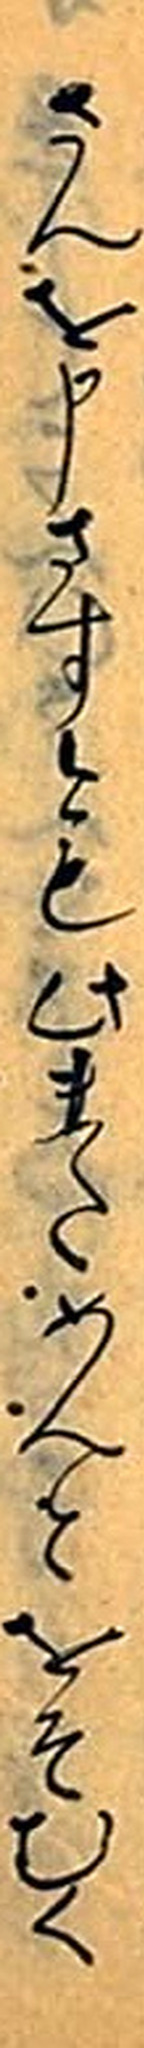さんを申さすとも此まためんとをそむく
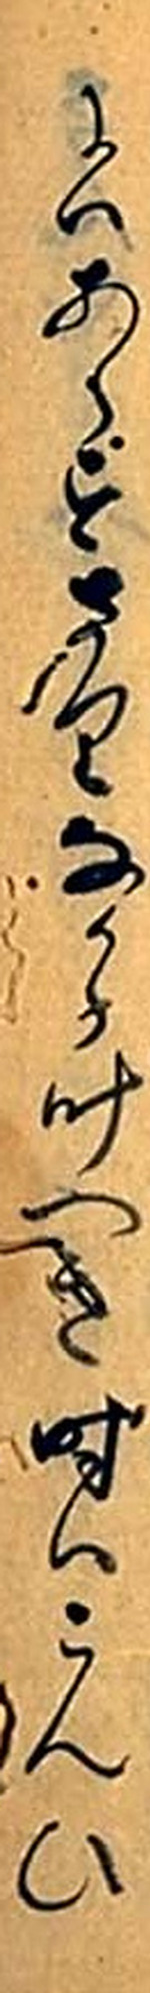にはあらすさりなから叶へき時はこんひ

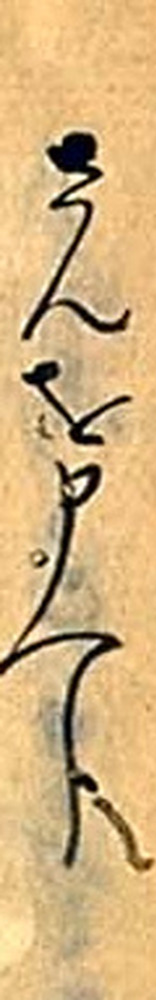さんを申へし
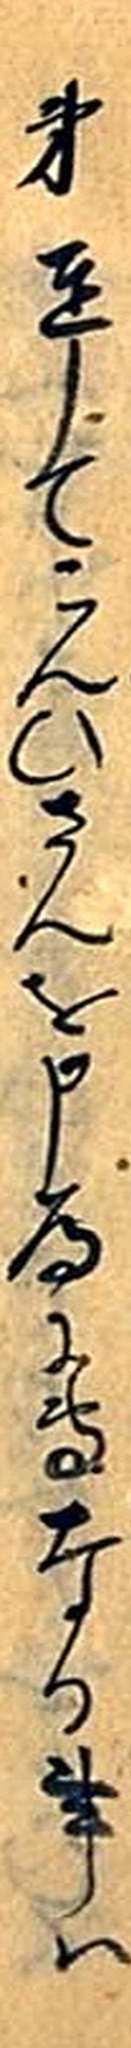弟達してこんひさんを申為に専なる事は
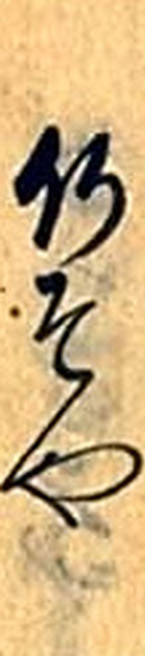何そや
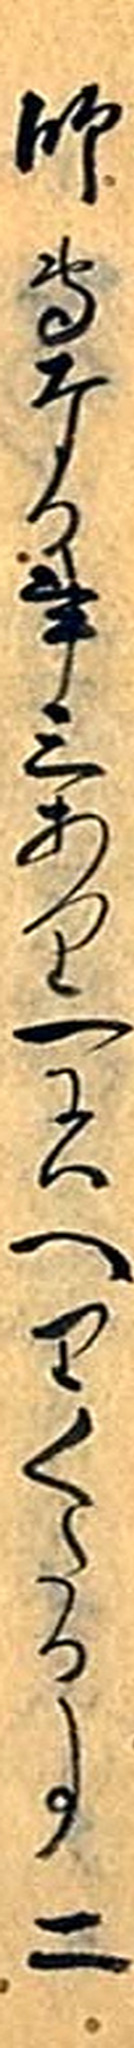師専なる事三あり一にはへりくたる事二
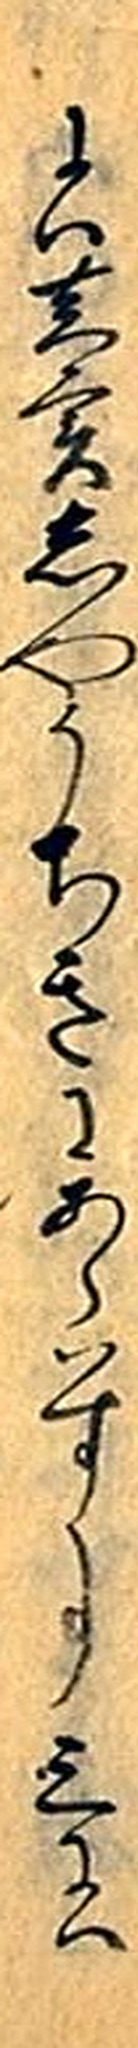には真実しやうちきにあらはす事三には
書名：ドチリナ・キリシタン
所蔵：東京大学総合図書館 / General Library in the University of Tokyo
